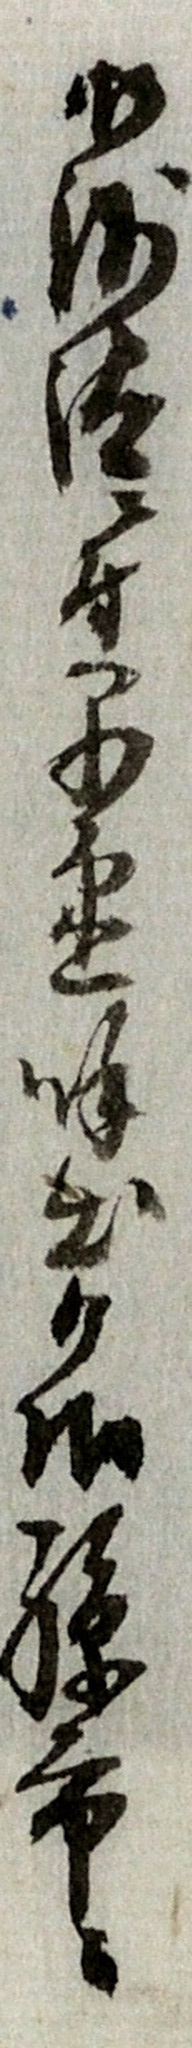御沙汰ニ付早速呼出候様孫市江
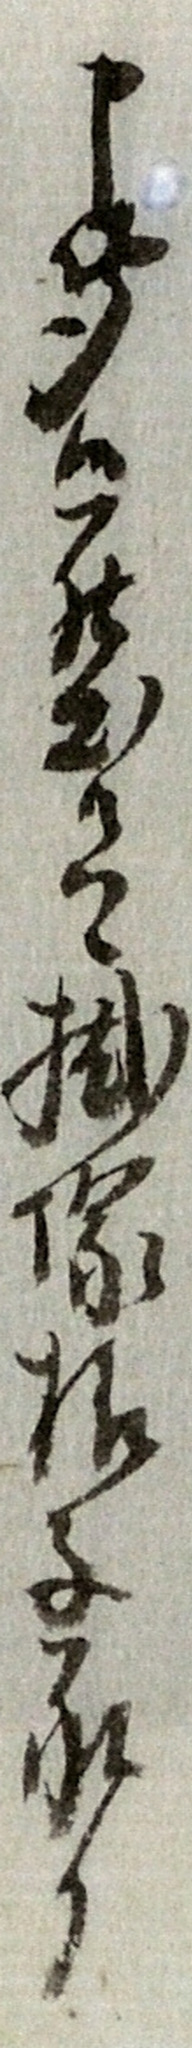申聞候罷出候ハゝ掛塚様子承り
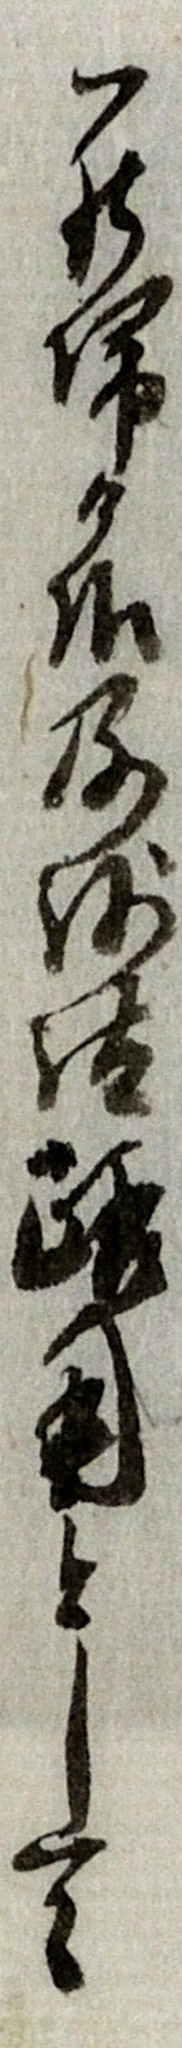罷帰候様及沙汰路用として
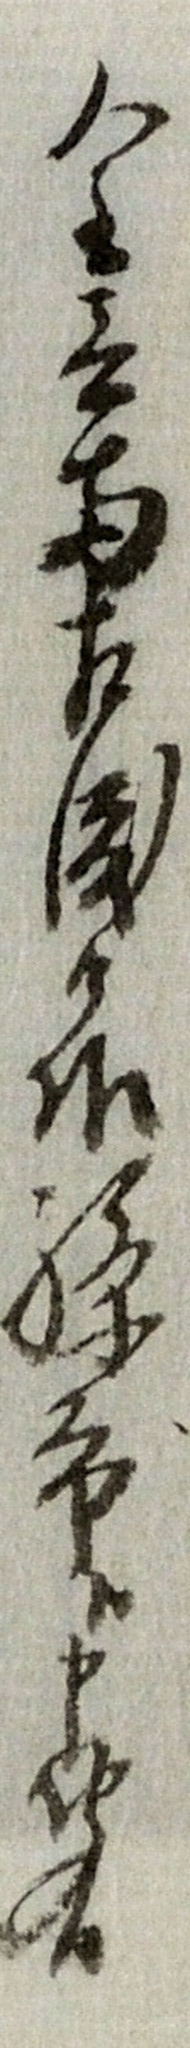金壱両相渡候様孫市江申聞候
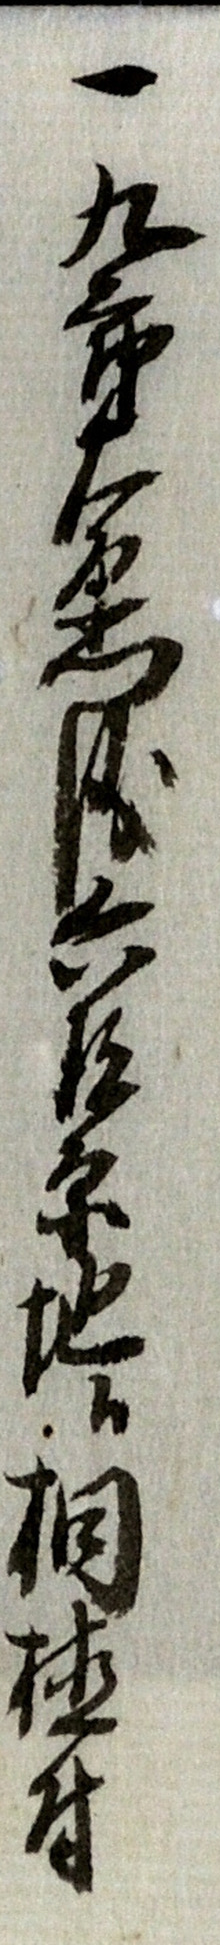一九郎右衛門儀六道原地江桐植付
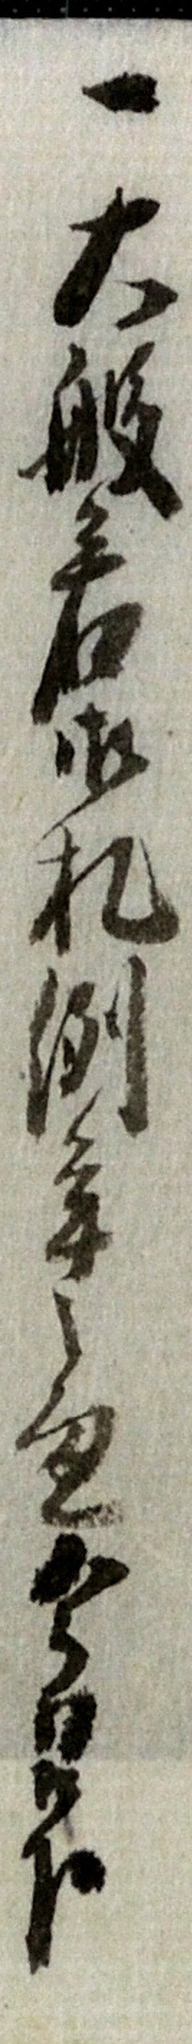一大般若御札例年之通今日御下
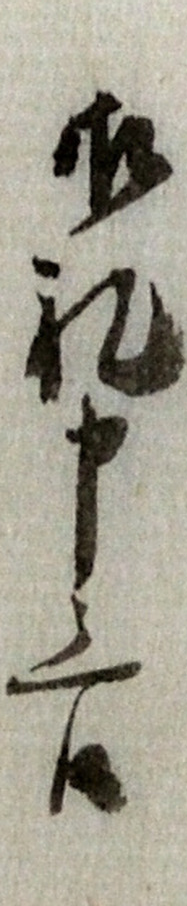御礼申上候
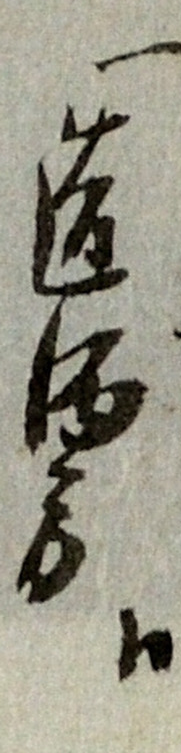造酒方江
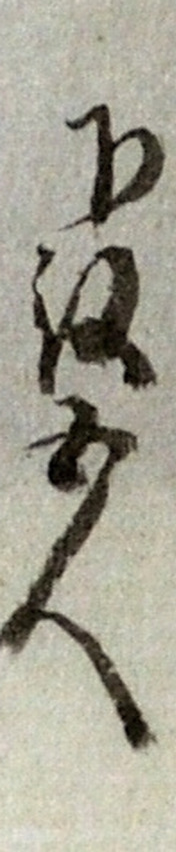下役五人

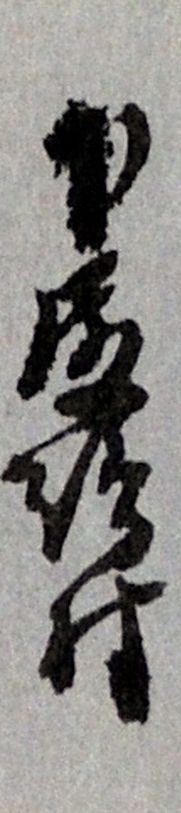下殿嶋村
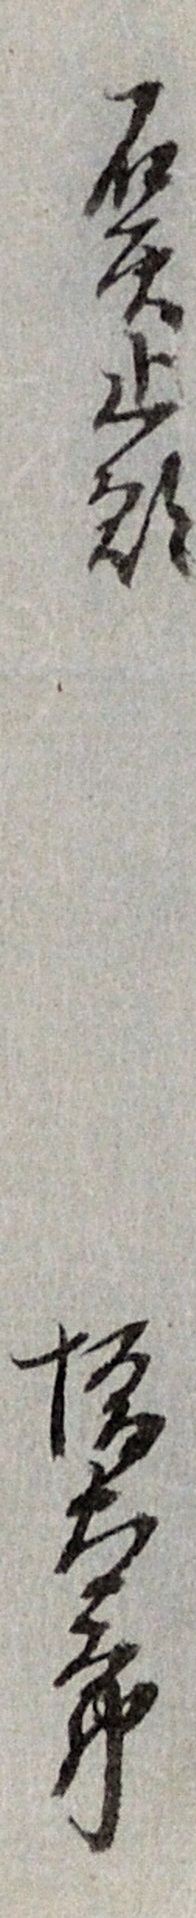石灰始増太郎
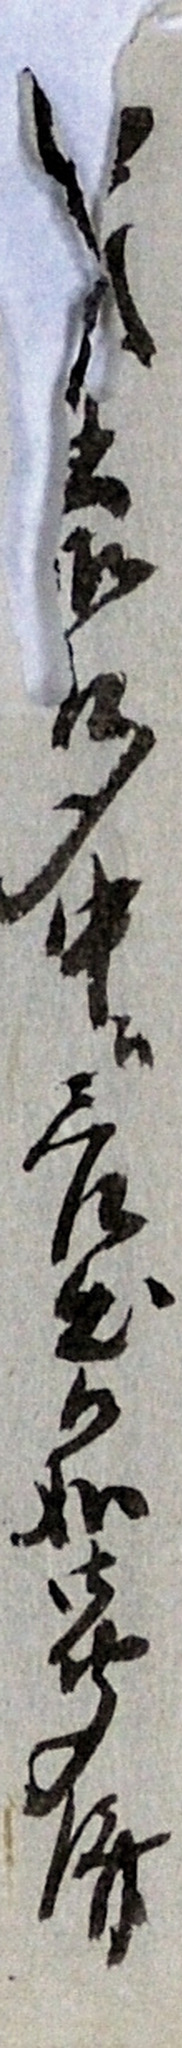御取〆中江差出候処御聞済
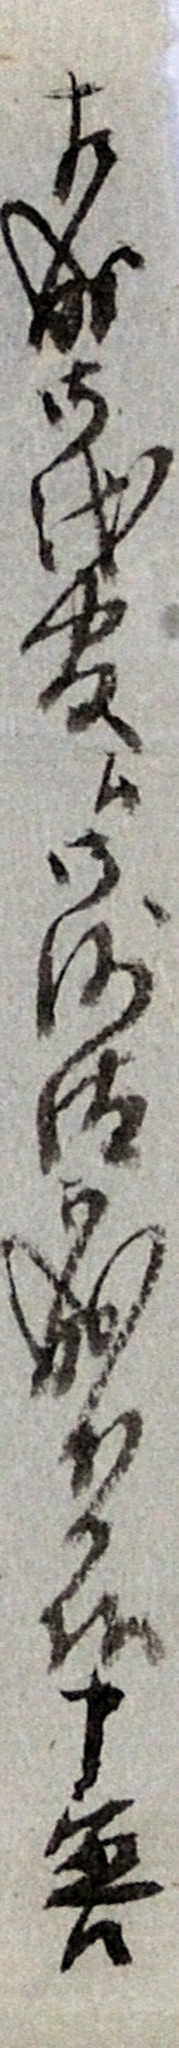相成御代官江御沙汰被成下候様申置候
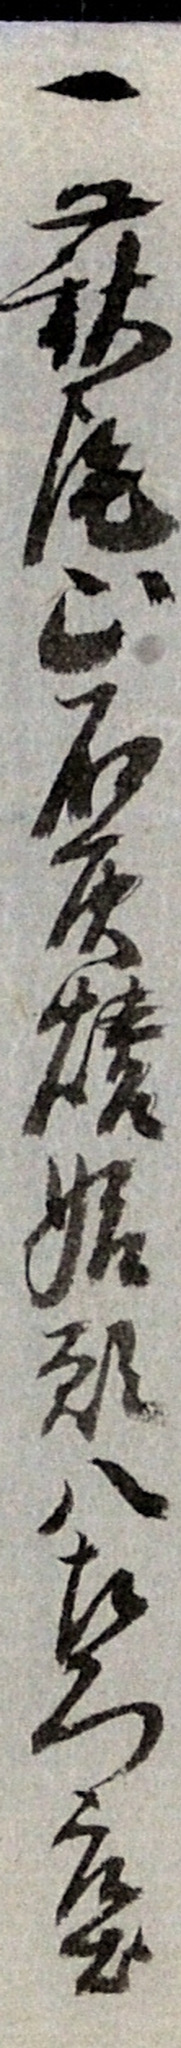一萩尾山石灰焼始願八左衛門差出
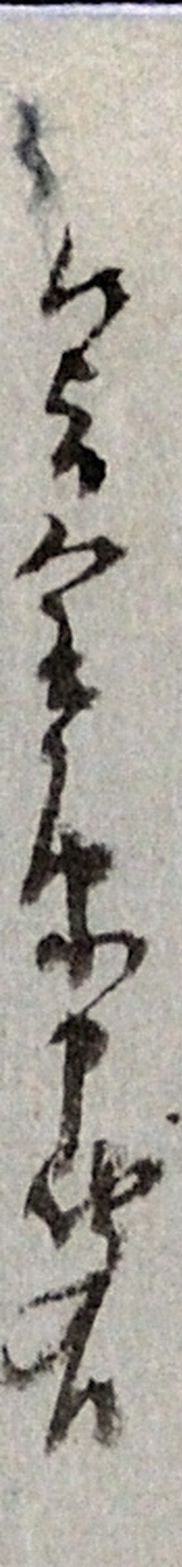候旨金兵衛申聞候
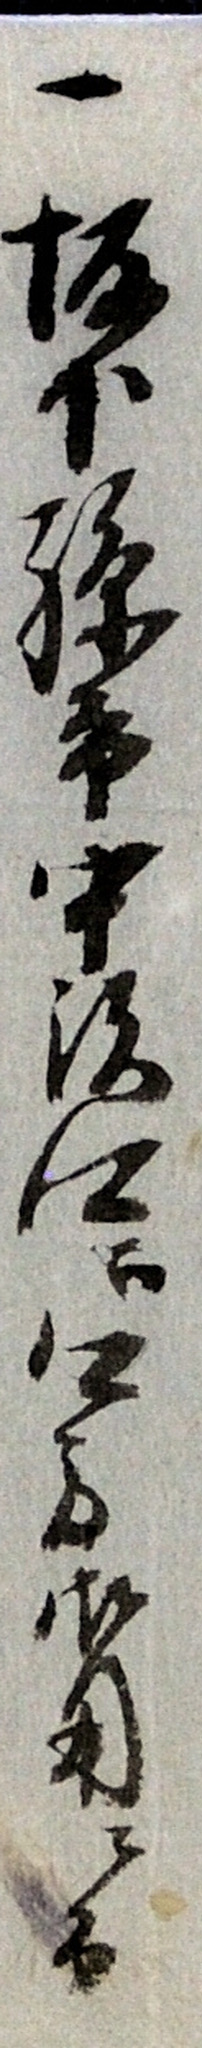一坂下孫市中沢郷江郷方御用ニ而
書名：諸事御用留
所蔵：伊那市立高遠町図書館・合同会社AMANE
